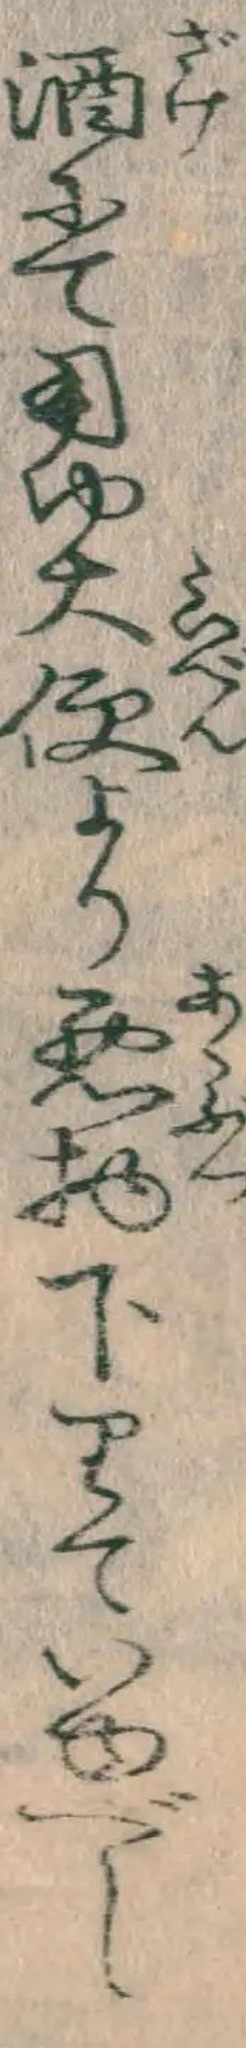酒にて用ゆ大便より悪物下りていゆべし
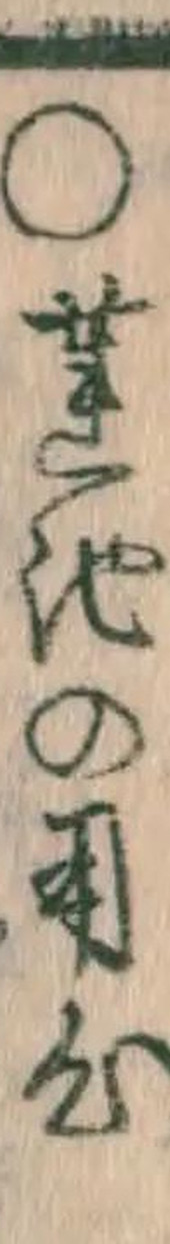○蓮池の用心
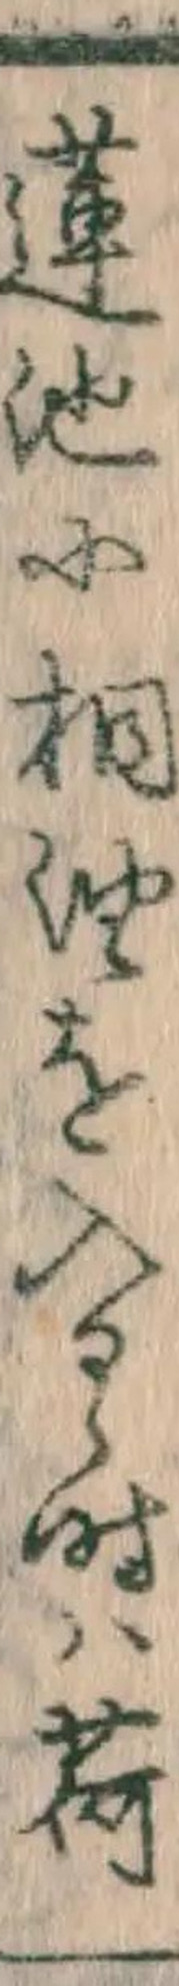蓮池に桐油を入るゝ時は荷
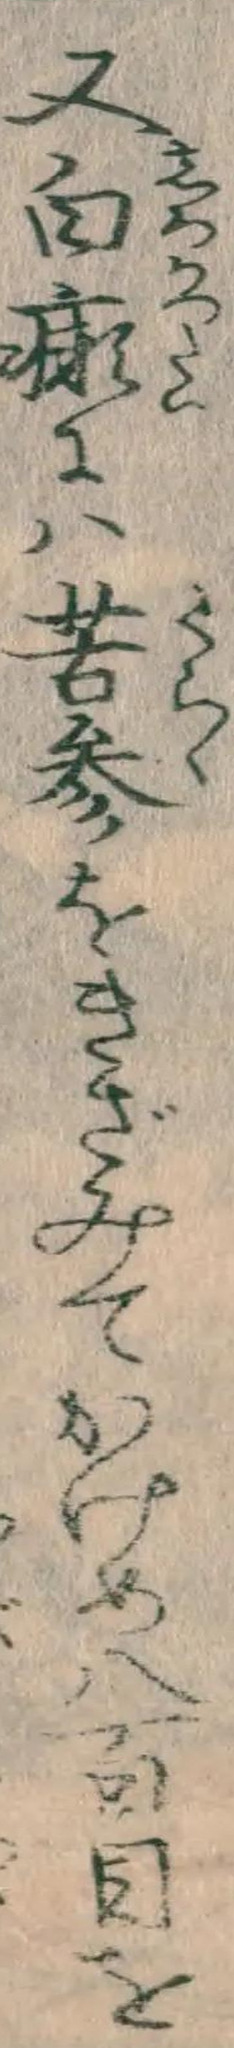又白癩には苦参をきざみてかけめ八百目を
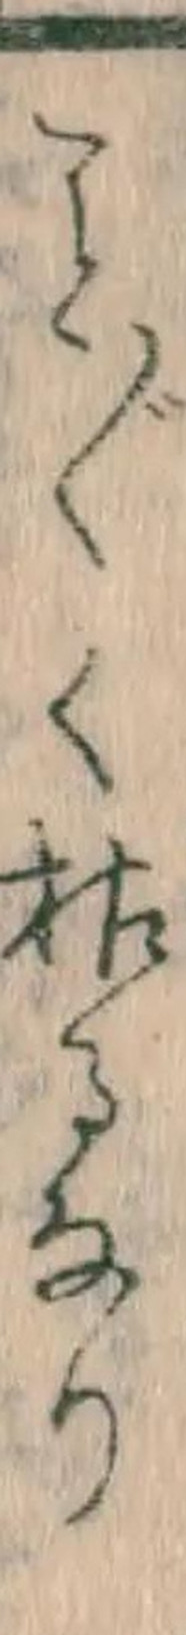こと〴〵く枯るなり
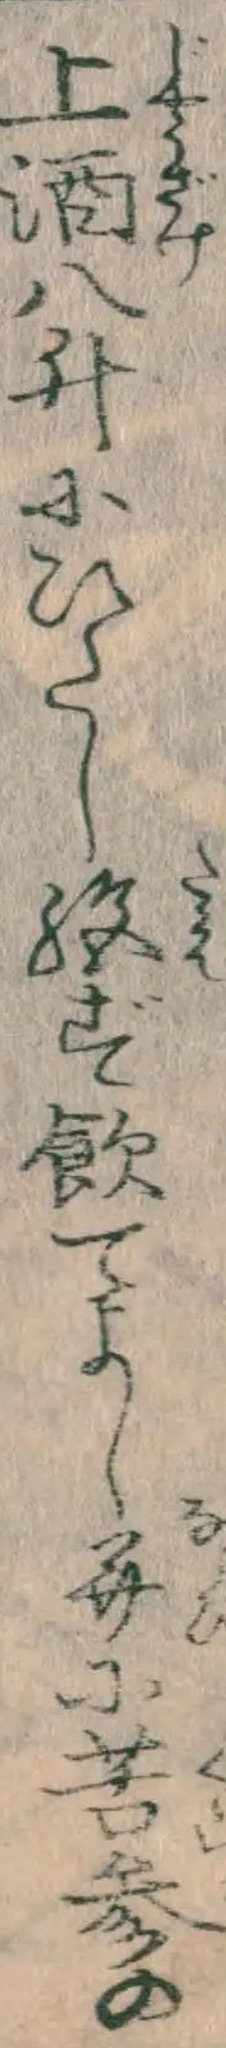上酒八升にひたし絶ず飲てよし幷に苦参の
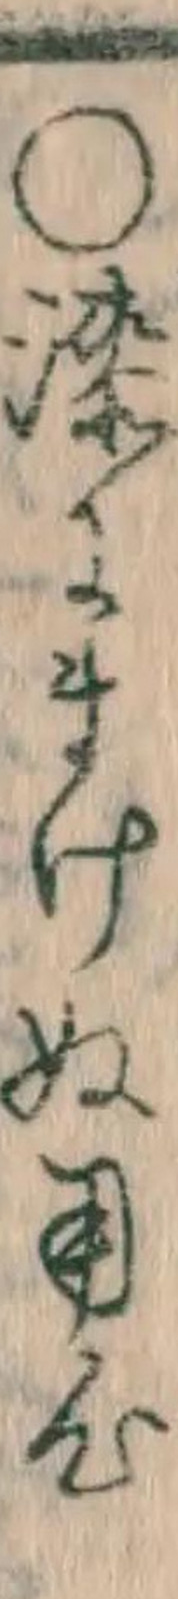○漆にまけぬ用心
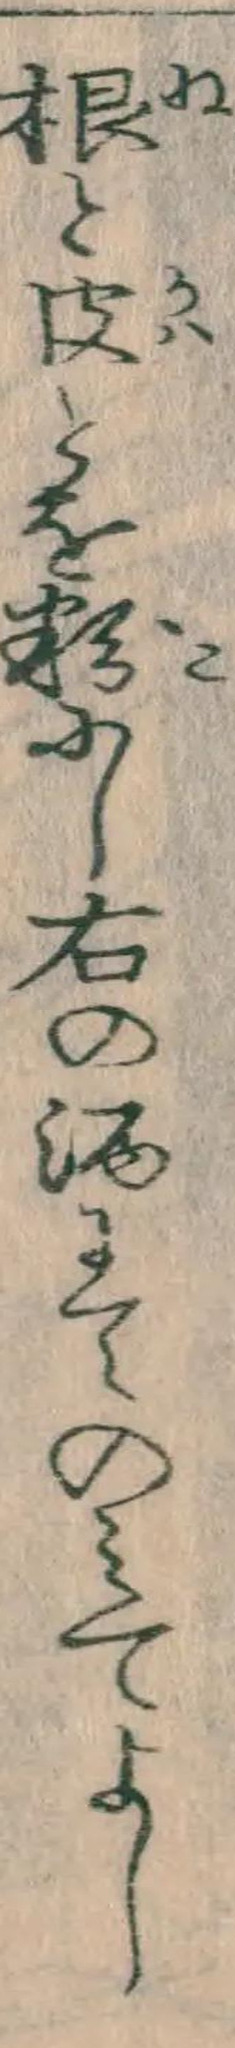根と皮とを粉にし右の酒にてのみてよし
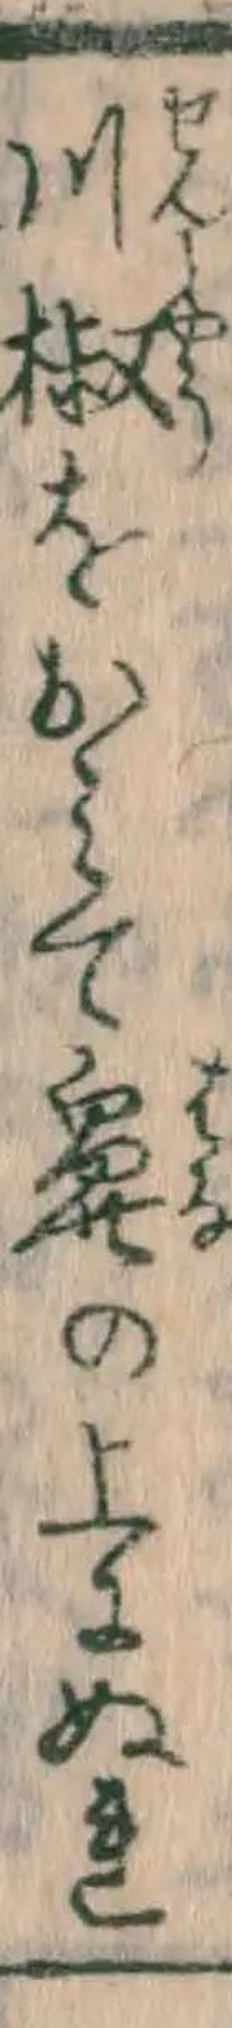川椒をかみて鼻の上にぬれ
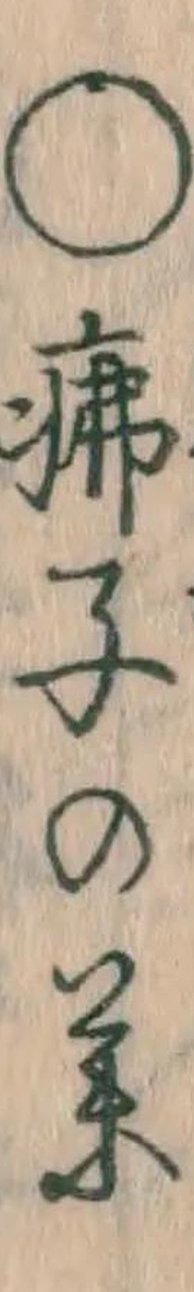○疿子の薬
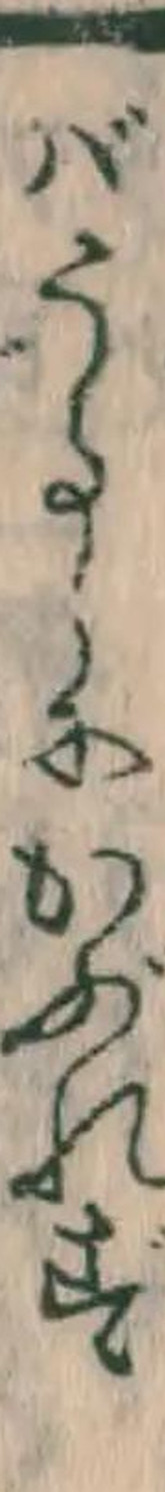ばうるしにかぶれず
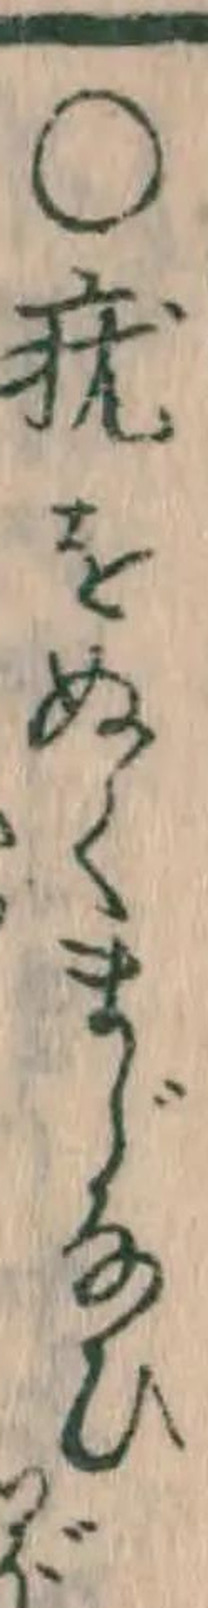○疣をぬくまじなひ
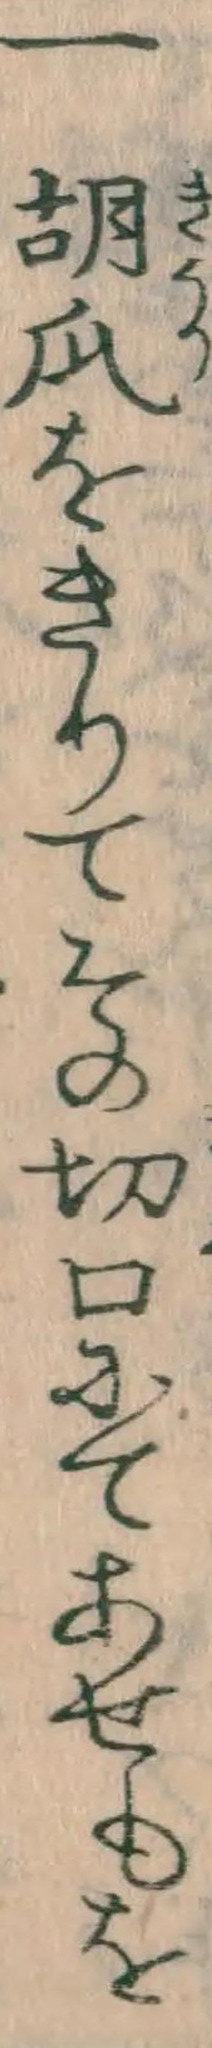一胡瓜をきりてその切口にてあせもを
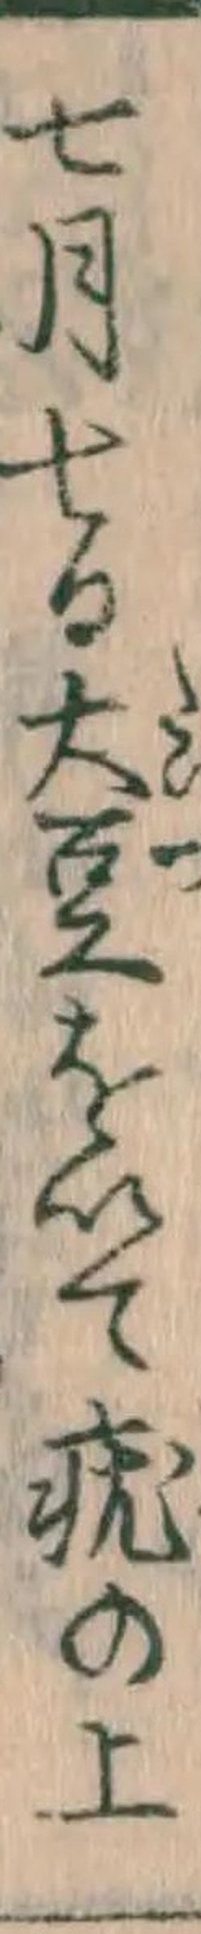七月七日大豆を以て疣の上
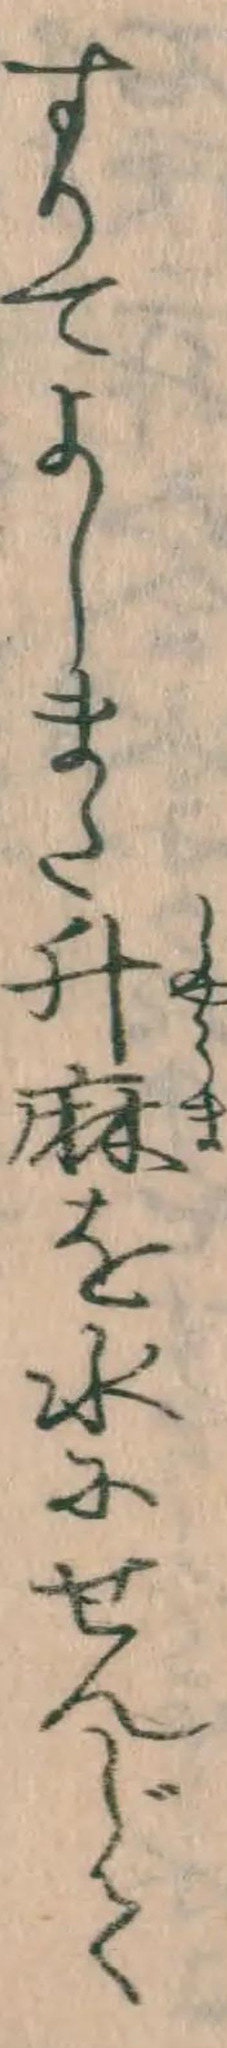すりてよしまた升麻を水にてせんじて
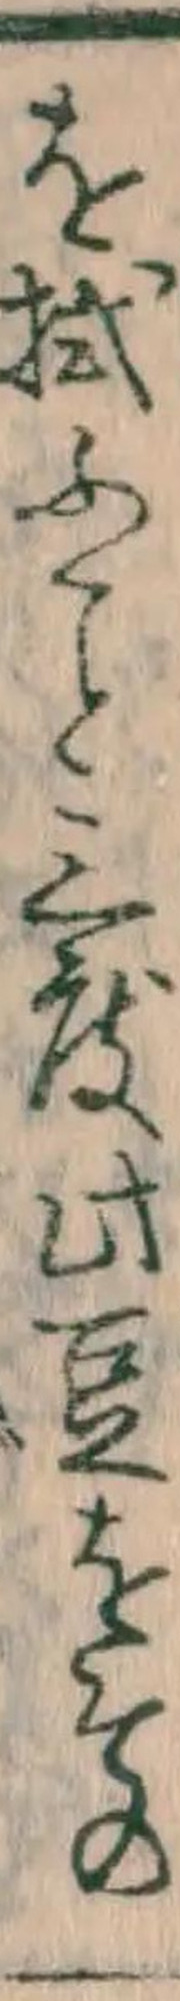を拭ふこと三度此豆をその
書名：広益秘事大全 3巻. [4]
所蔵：国立国会図書館 National Diet Library, JAPAN
